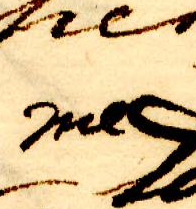me
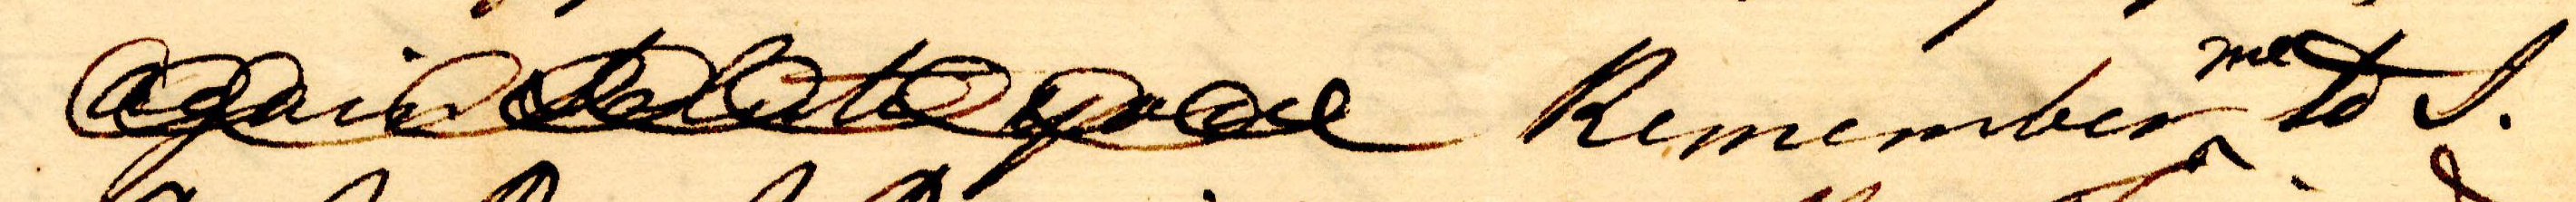[again Salute you] Remember ^ to S.
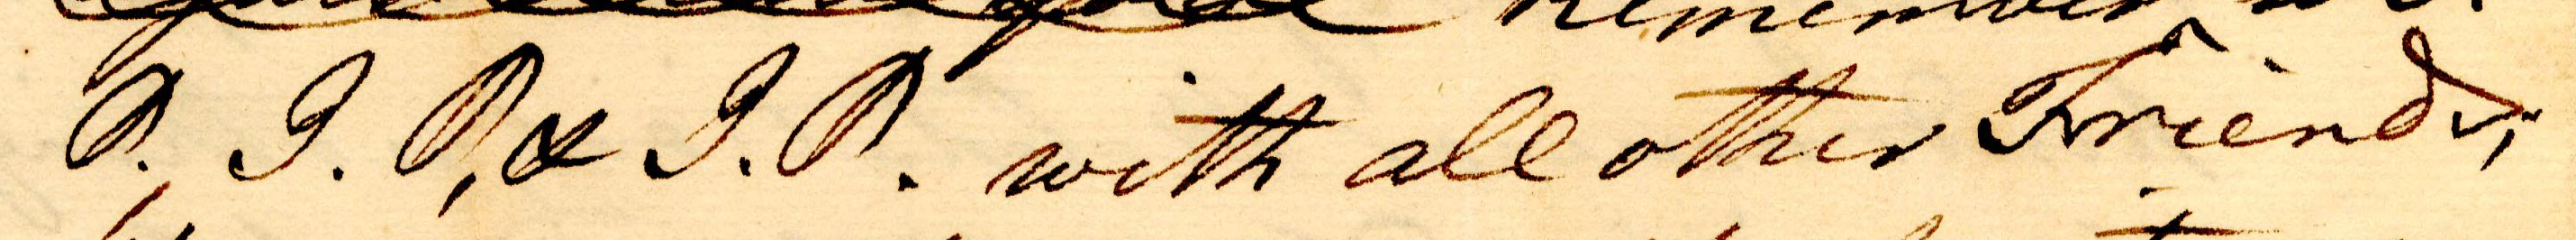P., J. P, & J. P. with all other Friends,
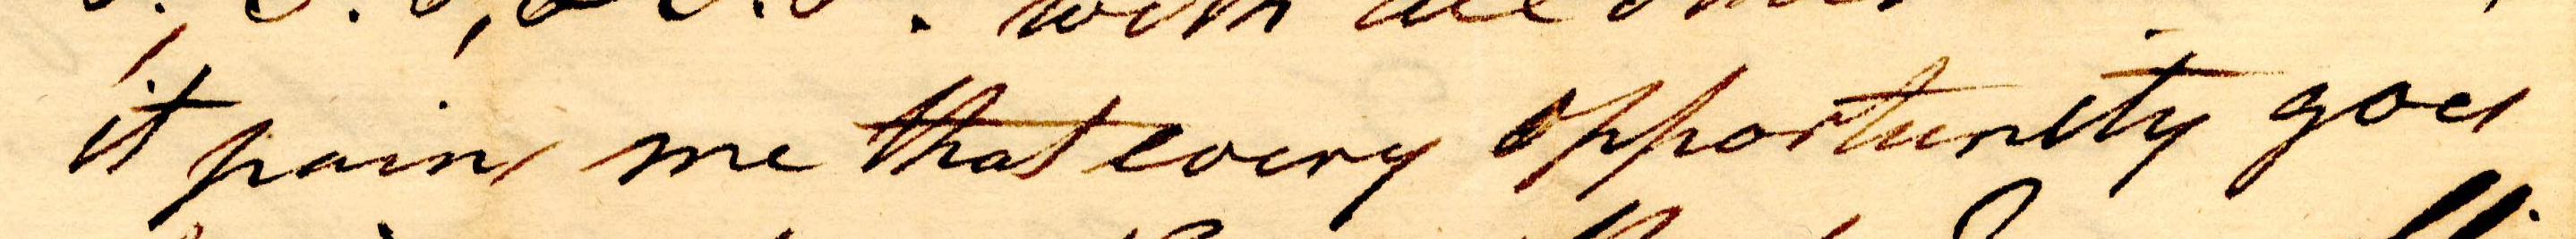it pains me that every opportunity goes
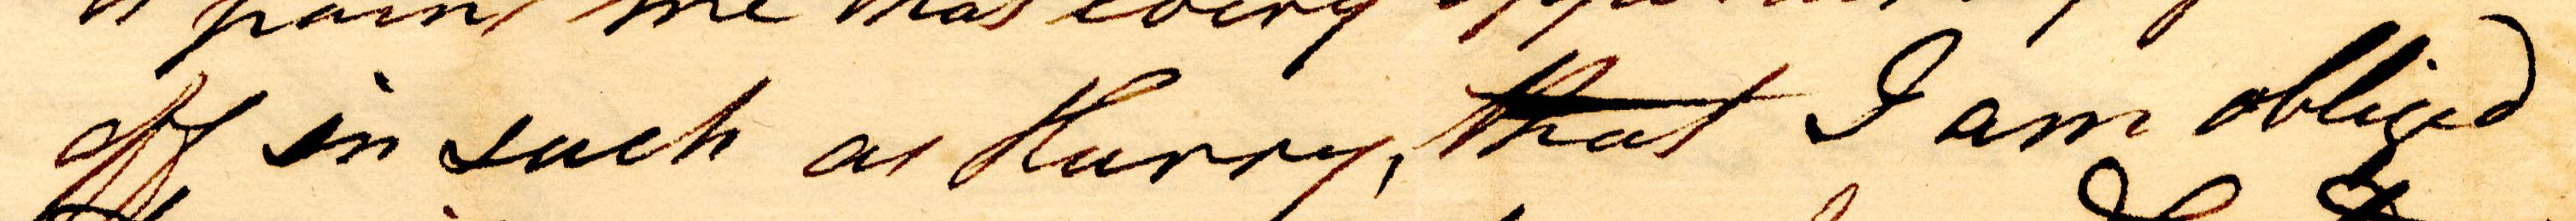off in such a Hurry, that I am obliged
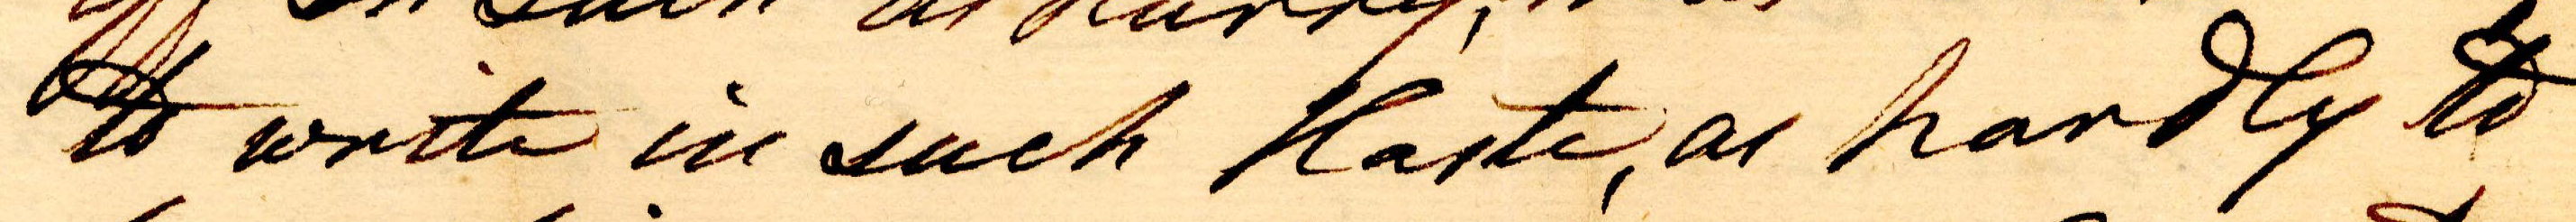to write in such Haste, as hardly to
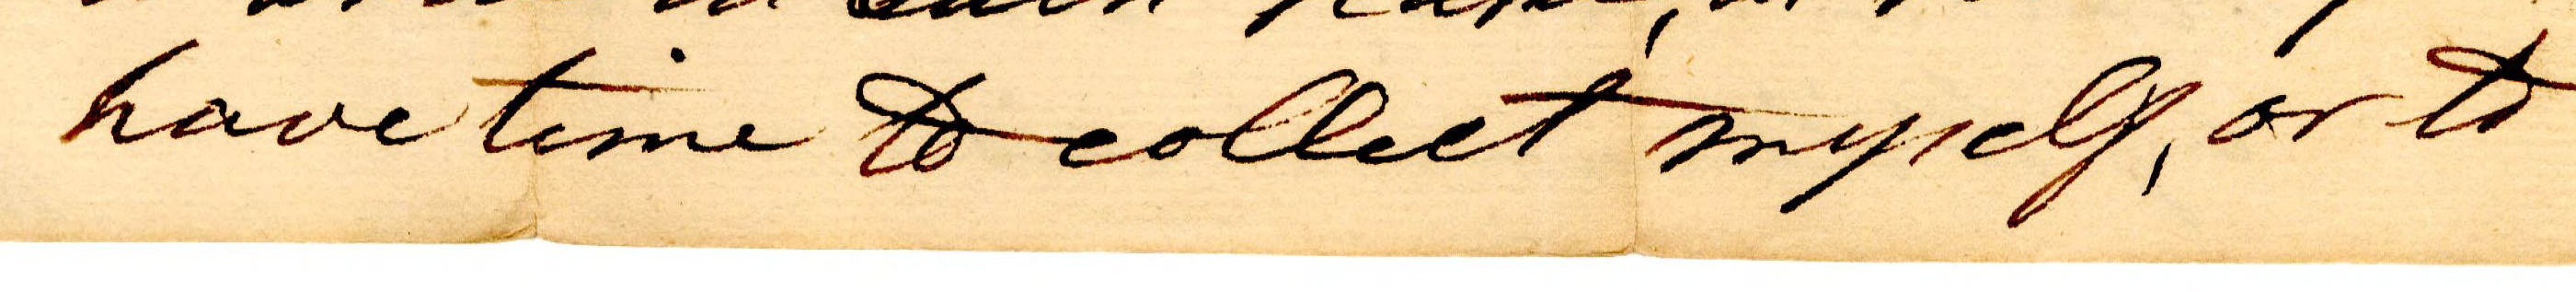have time to collect myself, or to
